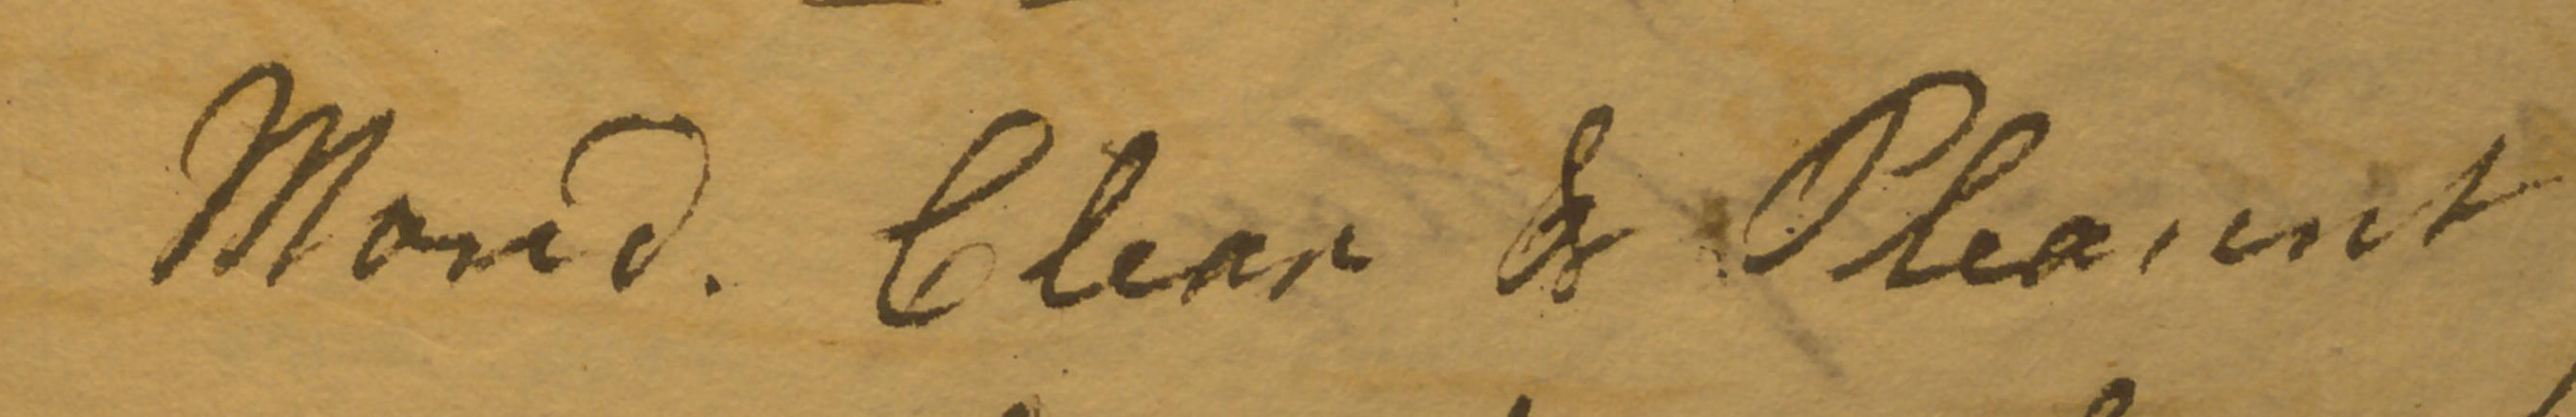Mond. Clear & Pleasent
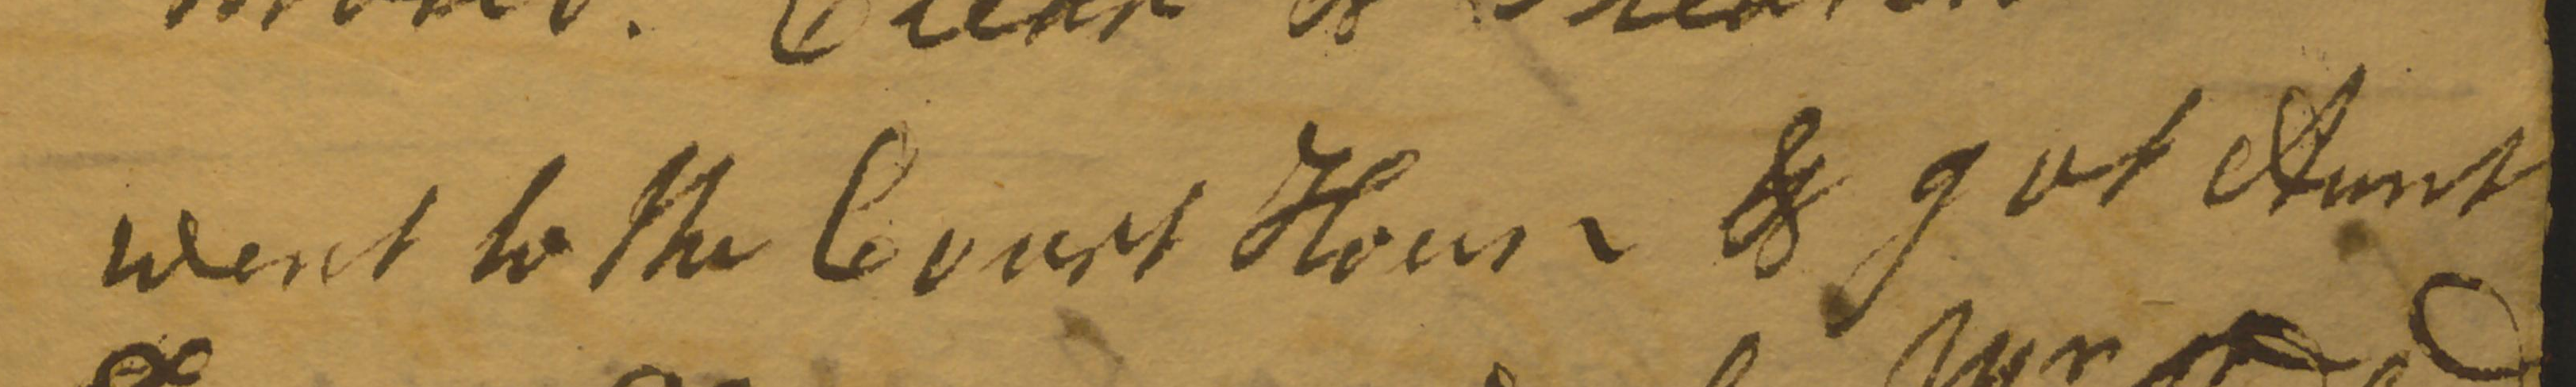went to the Court House & got Aunt
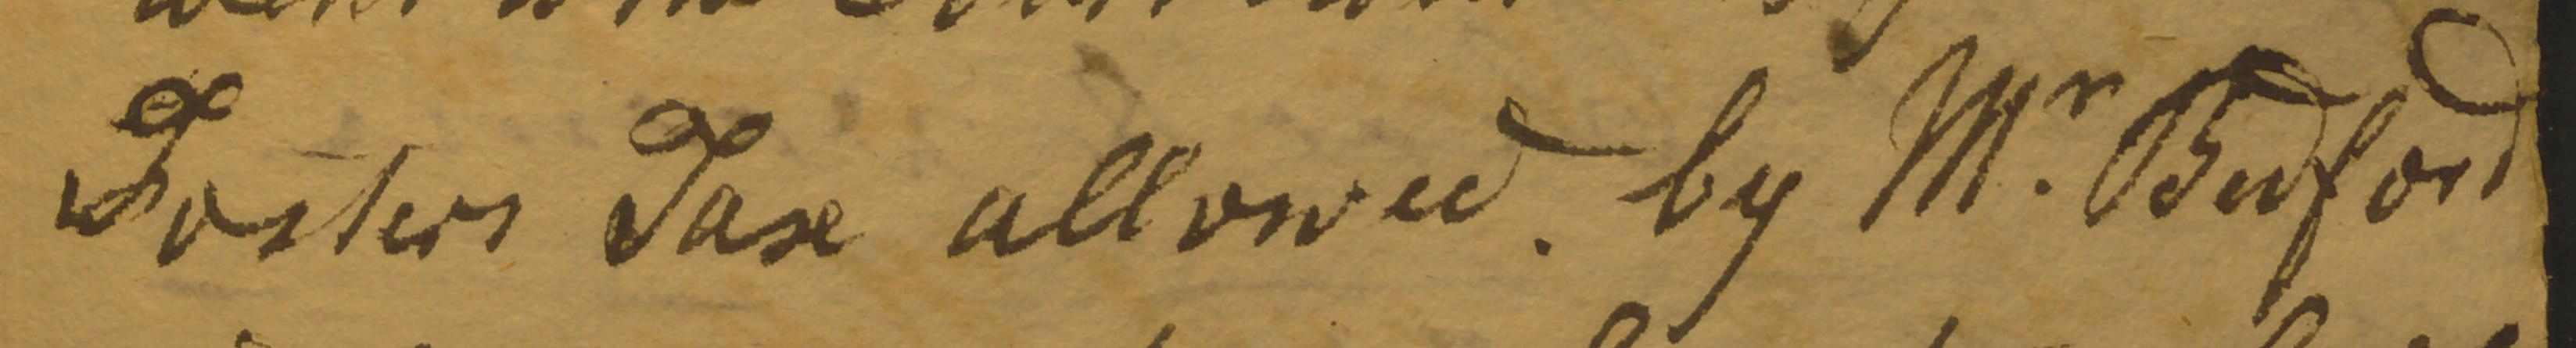Fosters Tax allowed by M^r. Bedford
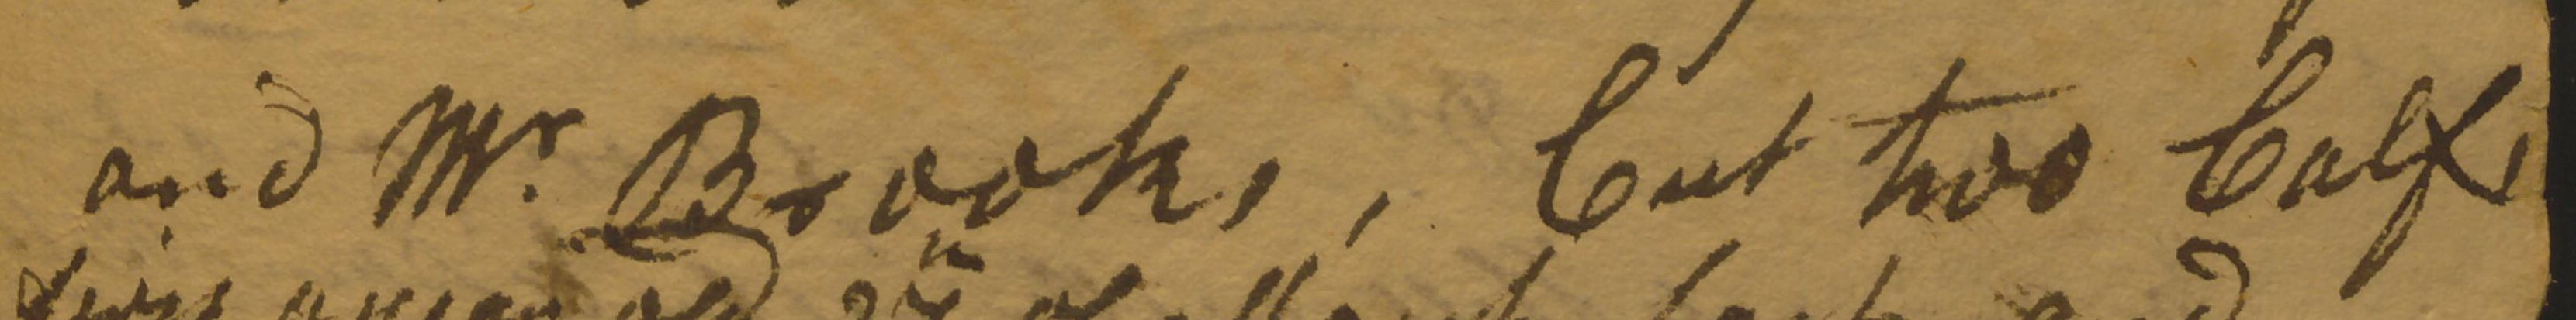and M^r. Brooks, Cut two Calf
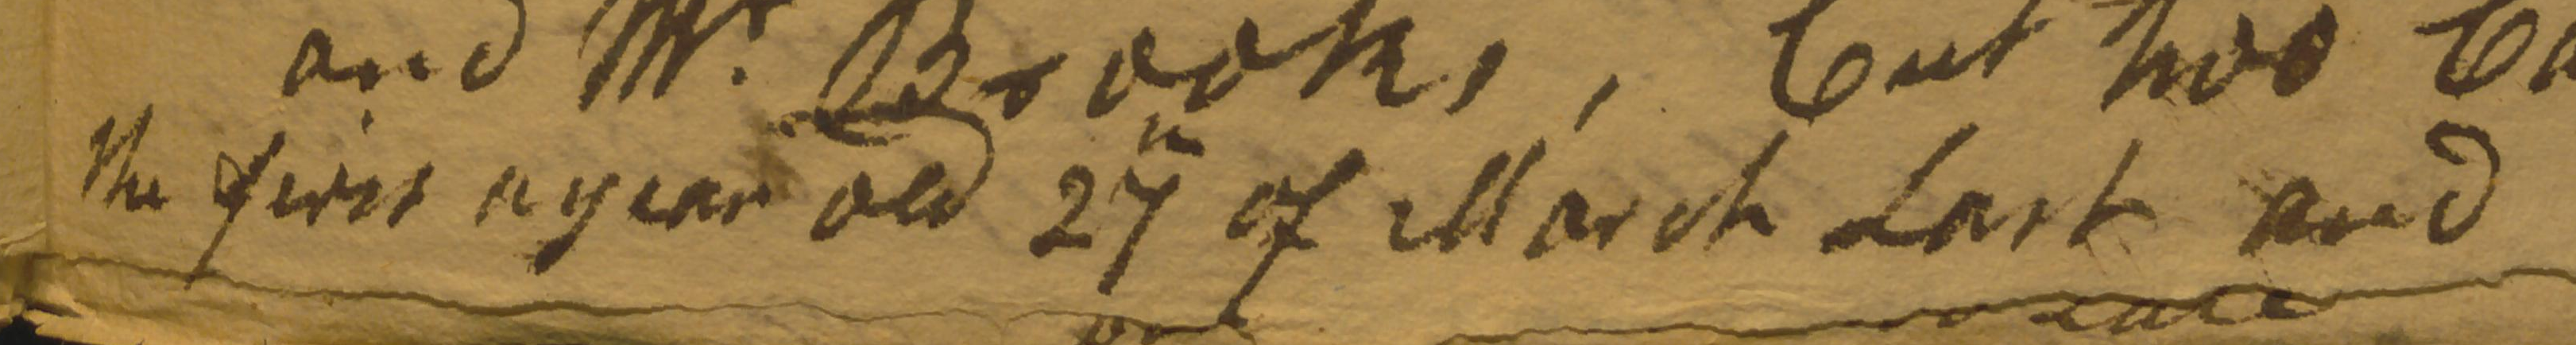the first a year old 27^th of March Last and
